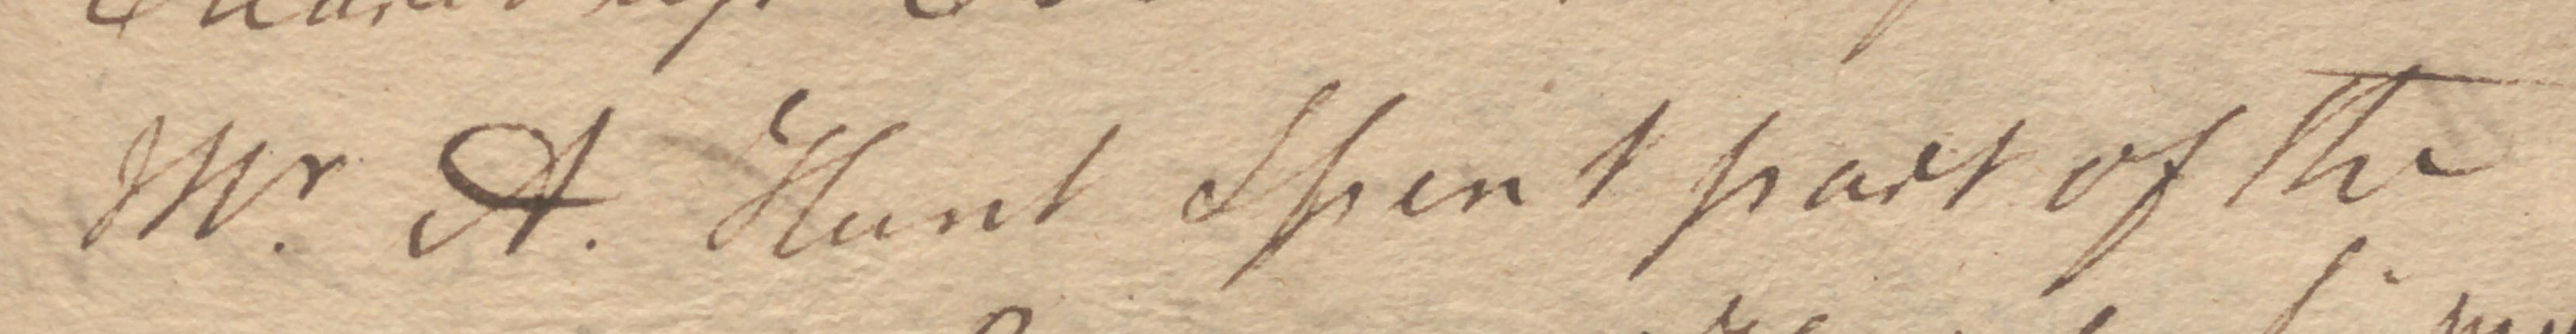M^r. A. Hunt spent part of the
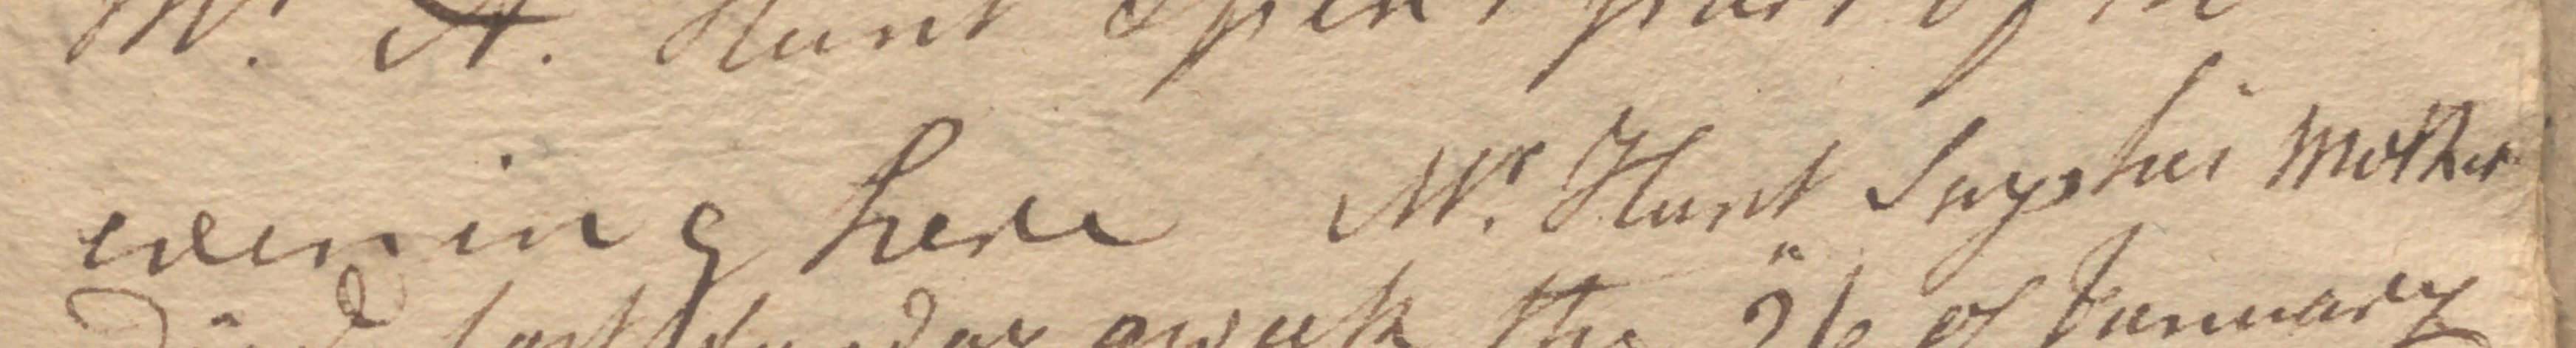evening here M^r. Hunt Says her Mother
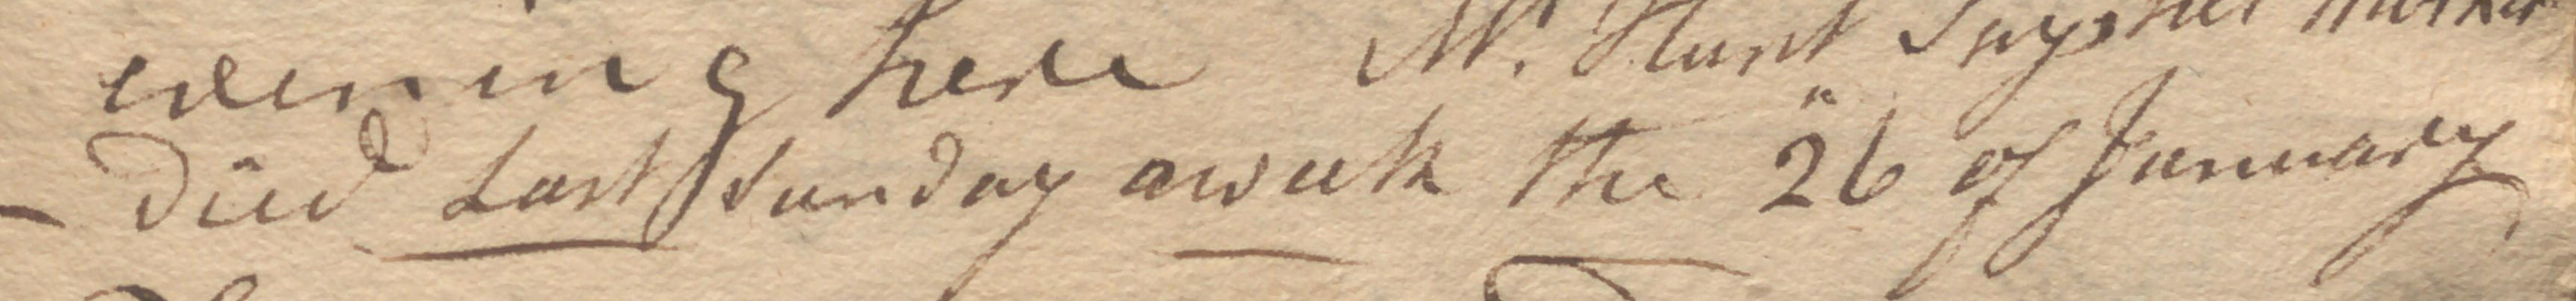died Last Sunday a week the 26^th of January
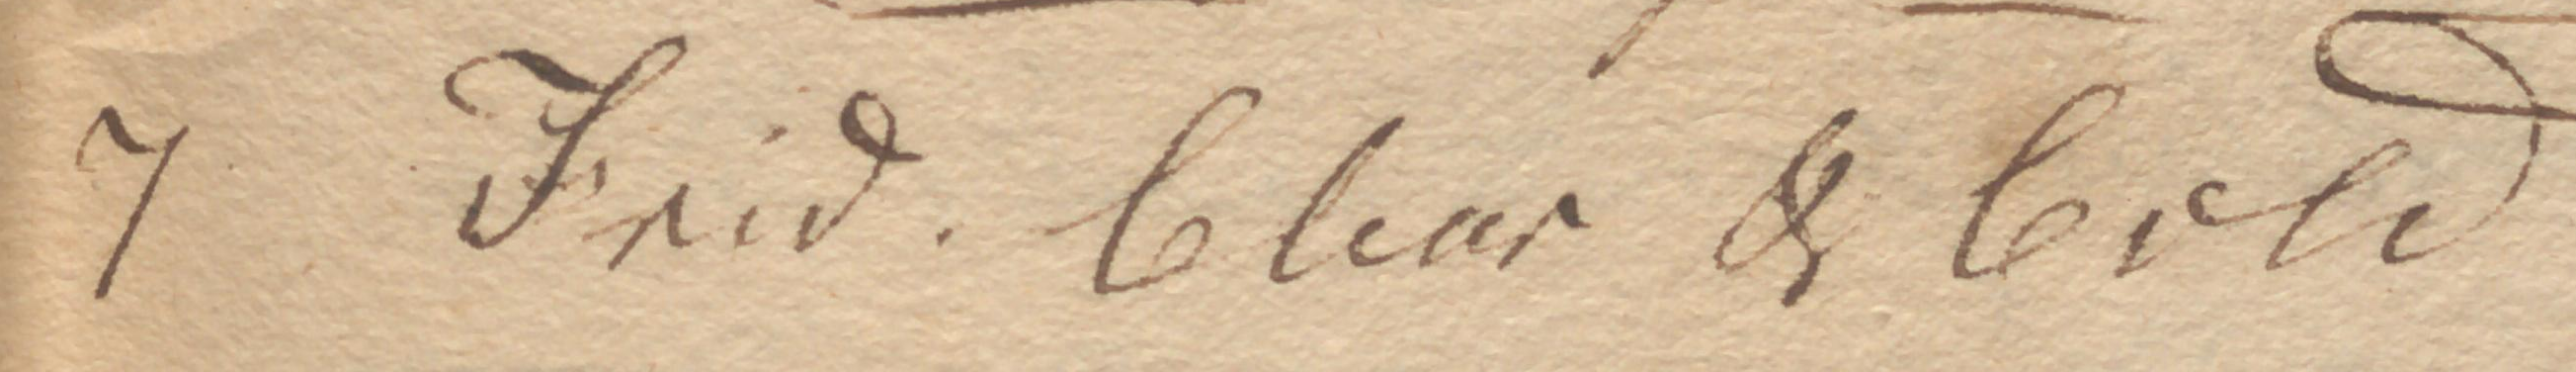7 Frid. Clear & Cold
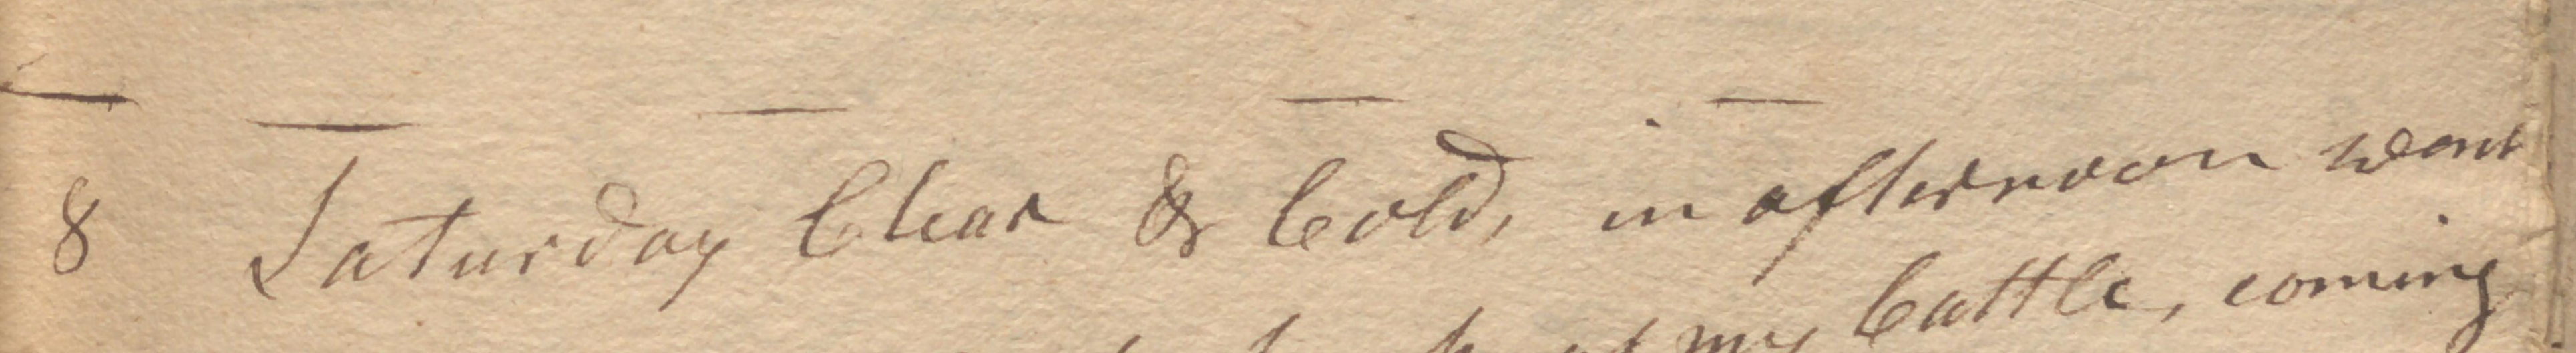8 Saturday Clear & Cold, in afternoon went
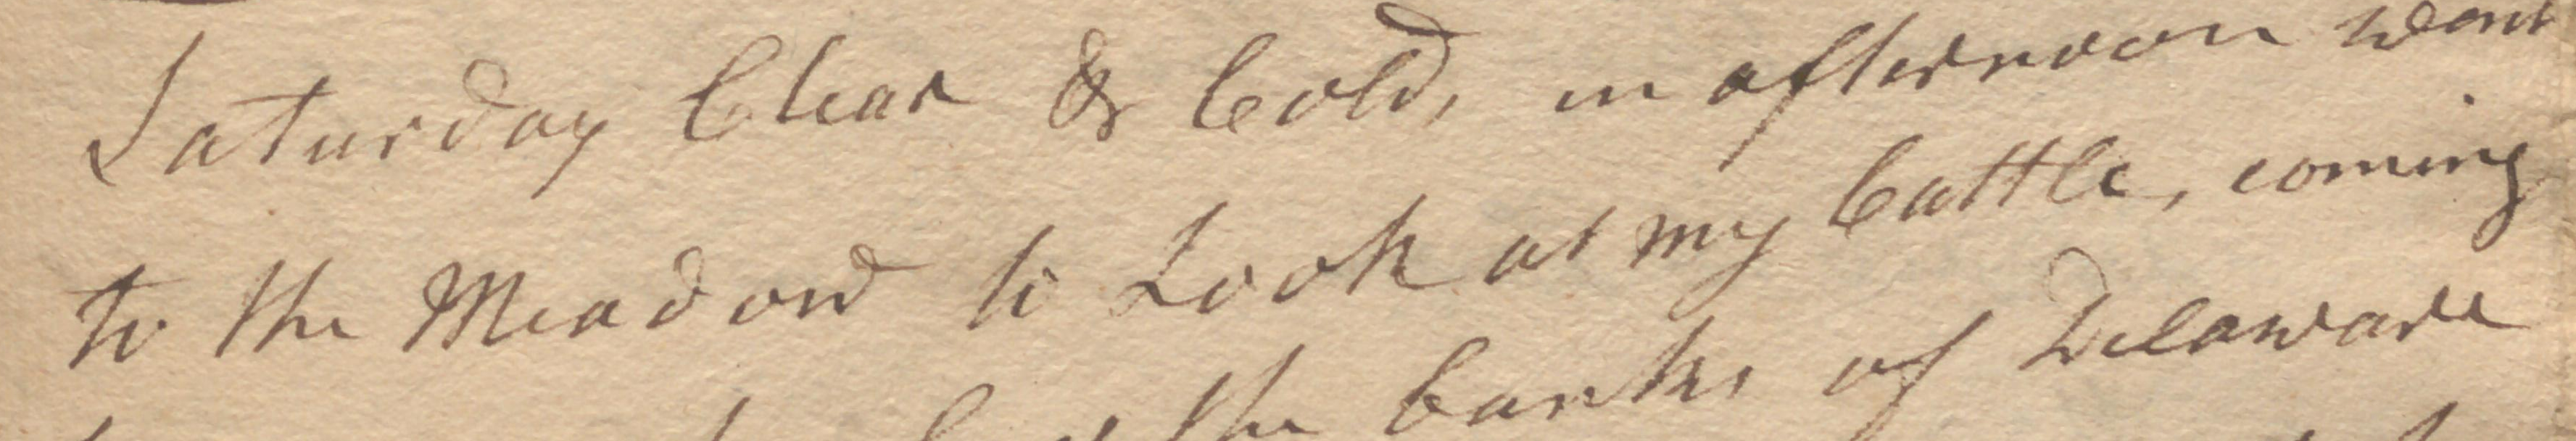to the Meadow to Look at my Cattle, coming
